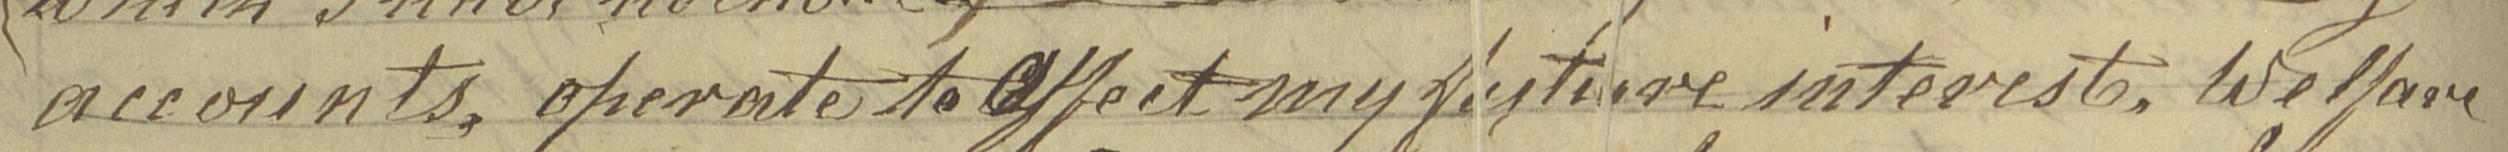accounts, operate to Affect my future interest, We share
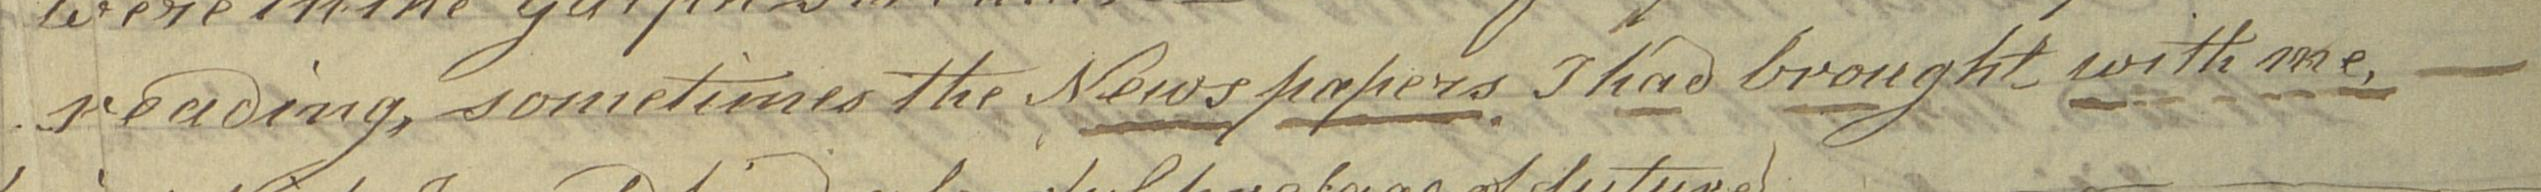reading sometimes the News papers I had brought with me,
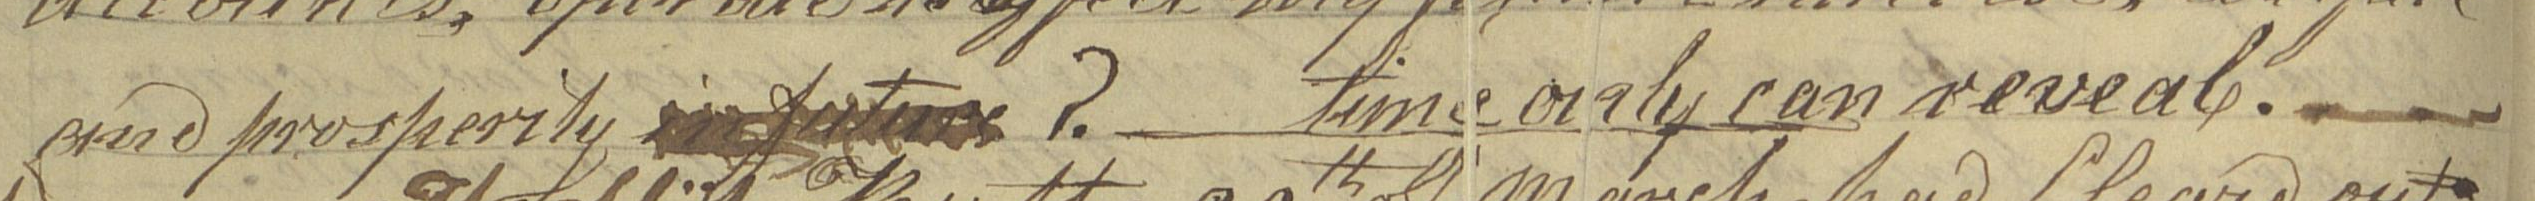and prosperity in future? time only can reveal.
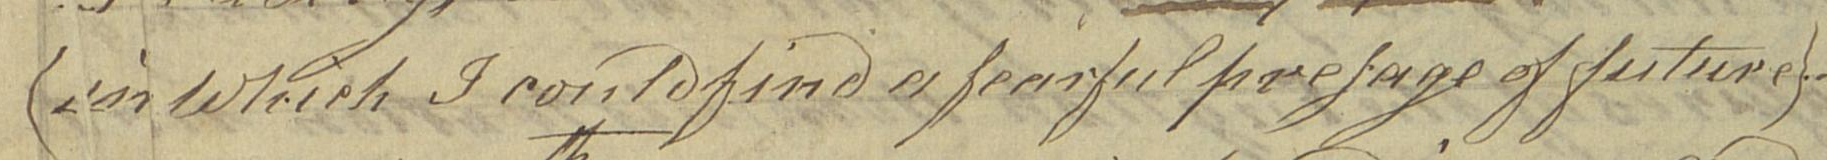(in which I could find a fearful presage of future)
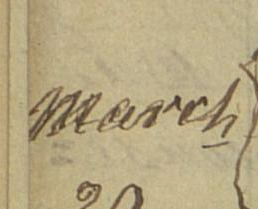March
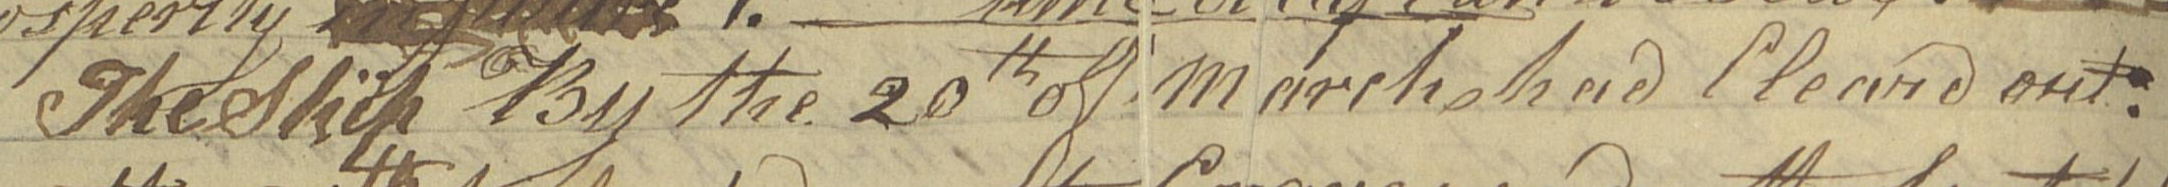The Ship By the 20^th of March had Cleard out.
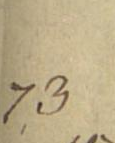73
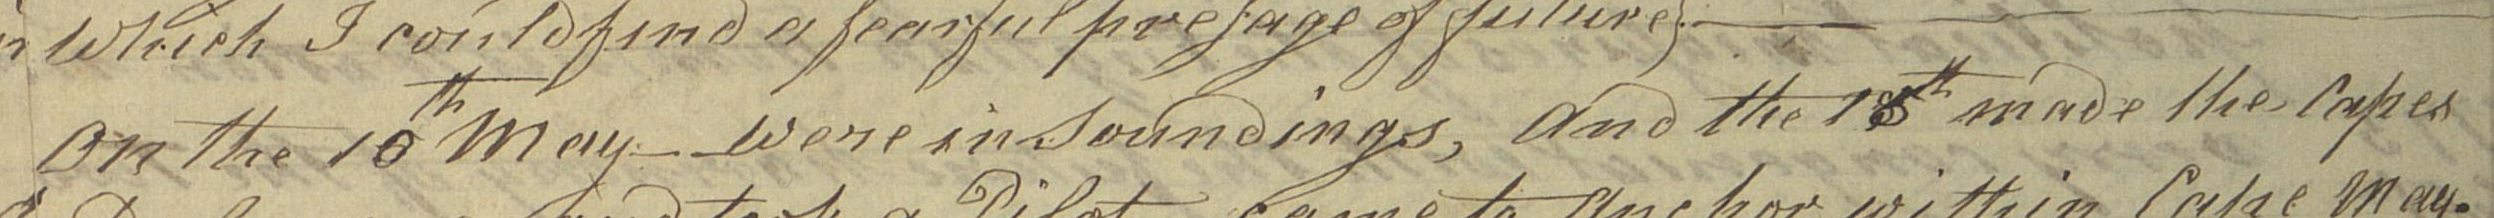On the 10^th May Were in Soundings, and the 15^th. made the Capes
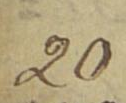20
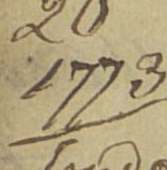1773
